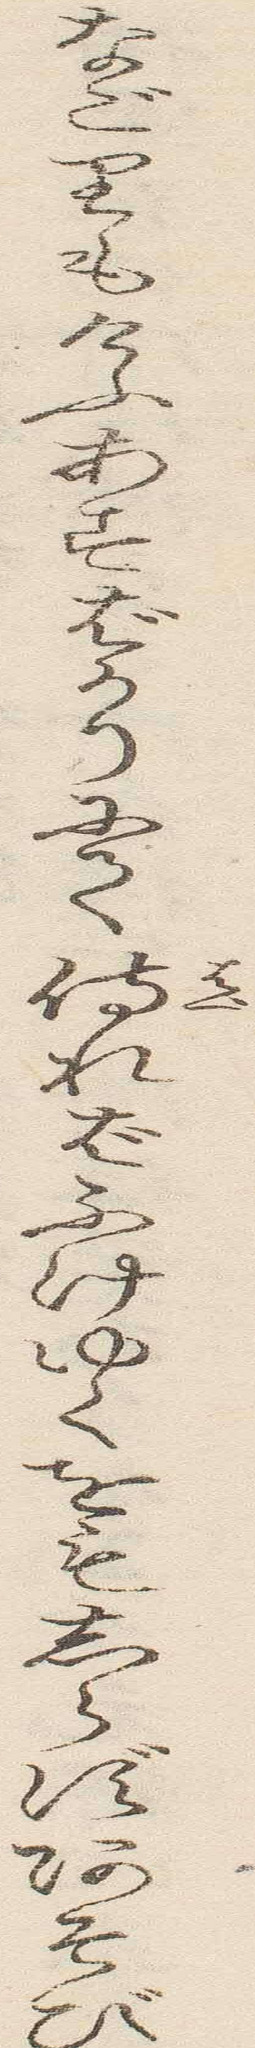なごりもけふあすばかりにて侍ればふけゆくをもしらずあそび
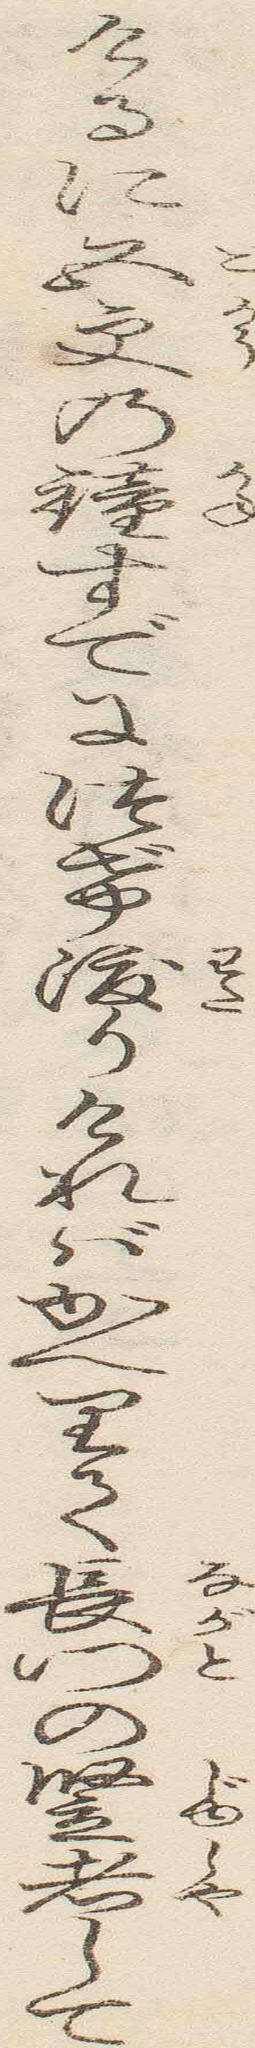けるに五更の鐘すでにつげ渡りければかへりて長門の竪者して
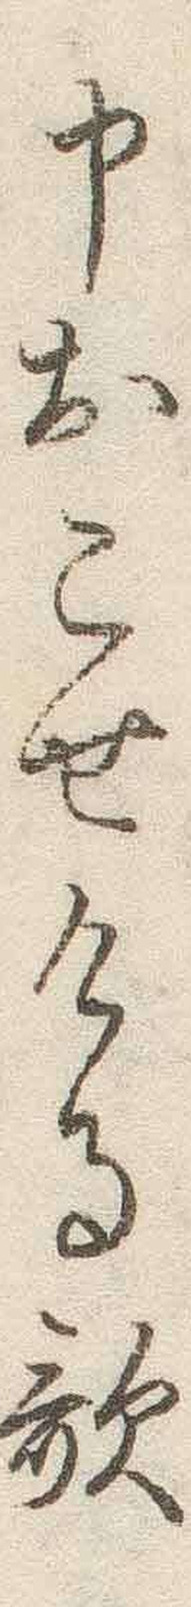申おこせける歌
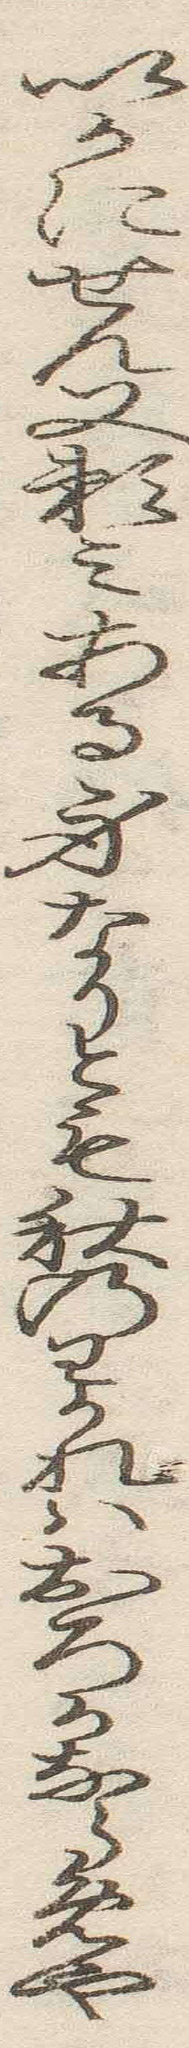いかにせん又頼みある身なりとも秋のわかれはおろかならめや
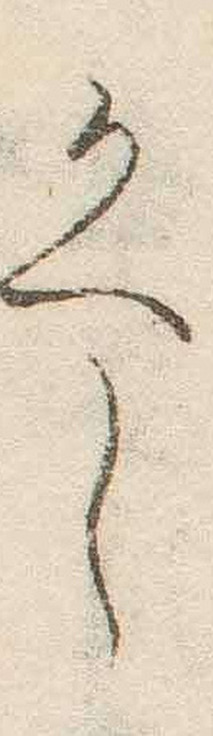かへし
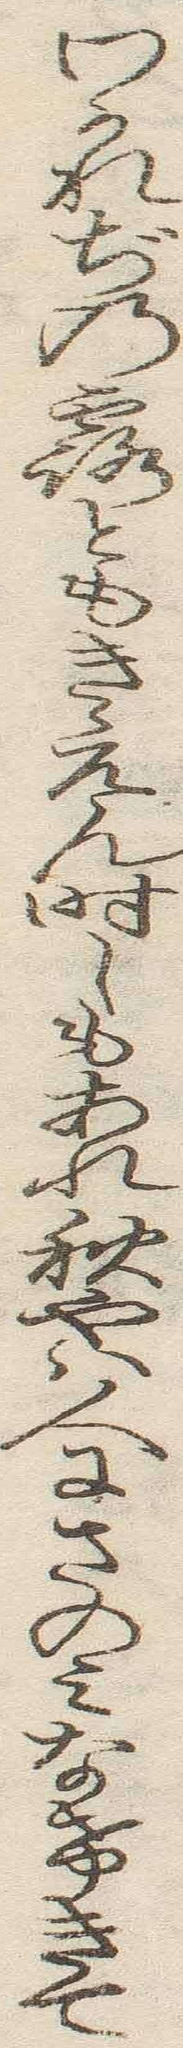わかれぢの露ともきえん时しもあれ秋やは人にさのみなけきて
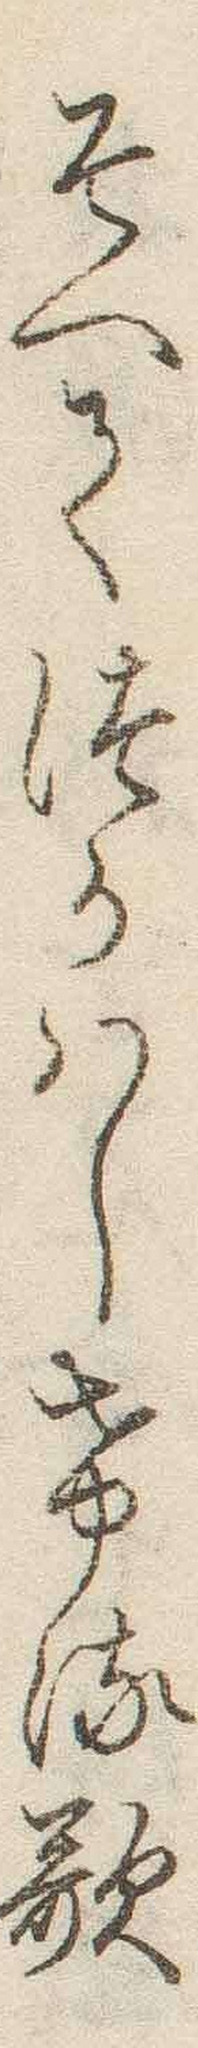そへてつかはしける歌
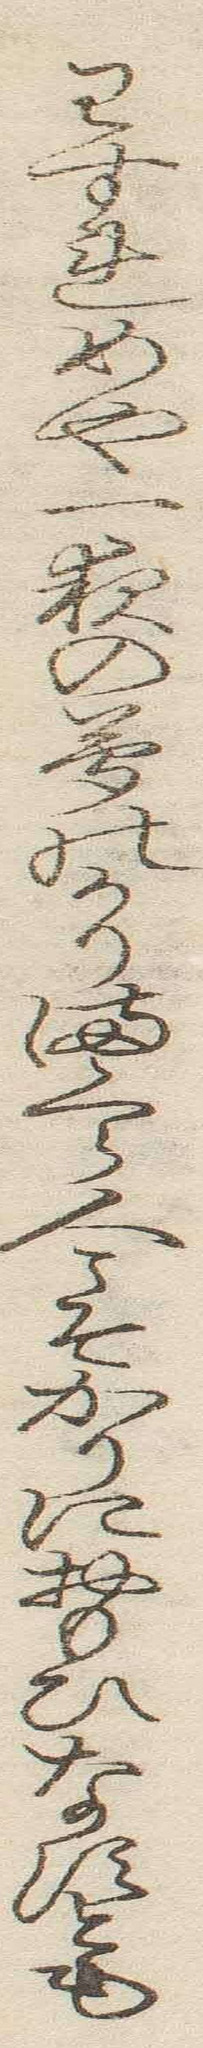わすれめや一夜の夢のかりまくら人こそかりにおもひなすとも
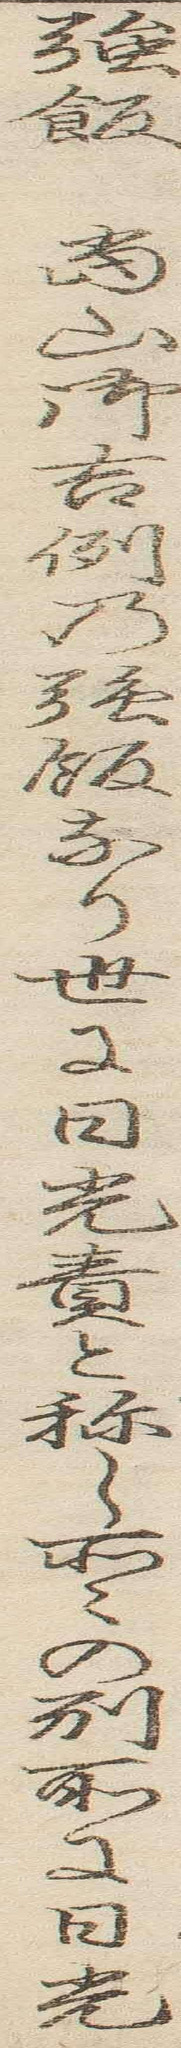強飯當山御吉例の強飯なり世に日光責と称し所〻の別所に日光
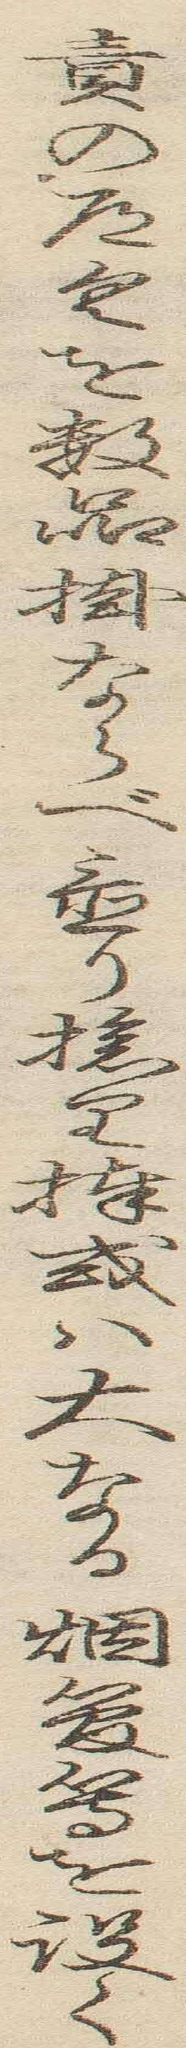責の道具を数品掛ならべ置り捻り棒或は大なる烟管等を設く

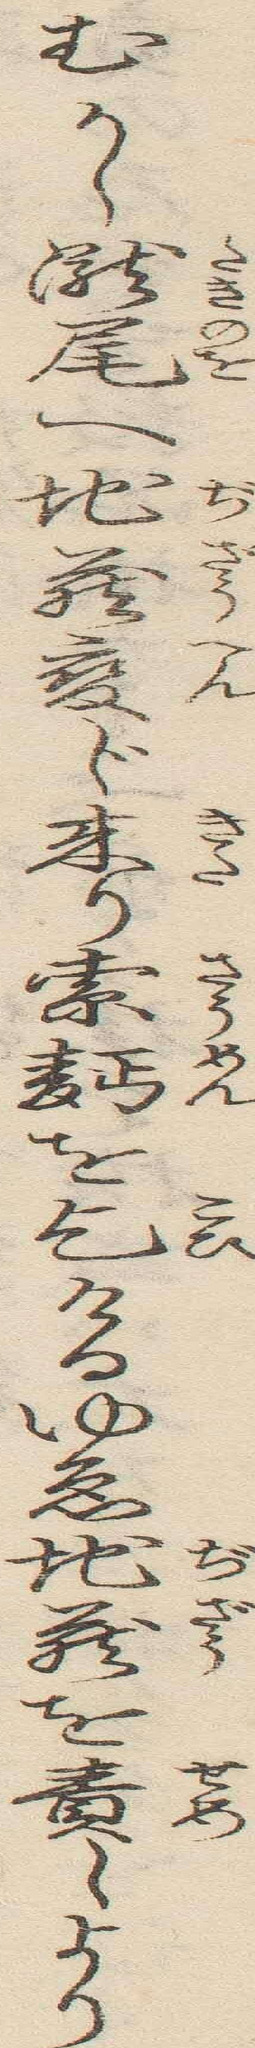むかし瀧尾へ地蔵変じ来り索麪を乞けるゆゑ地蔵を責しより
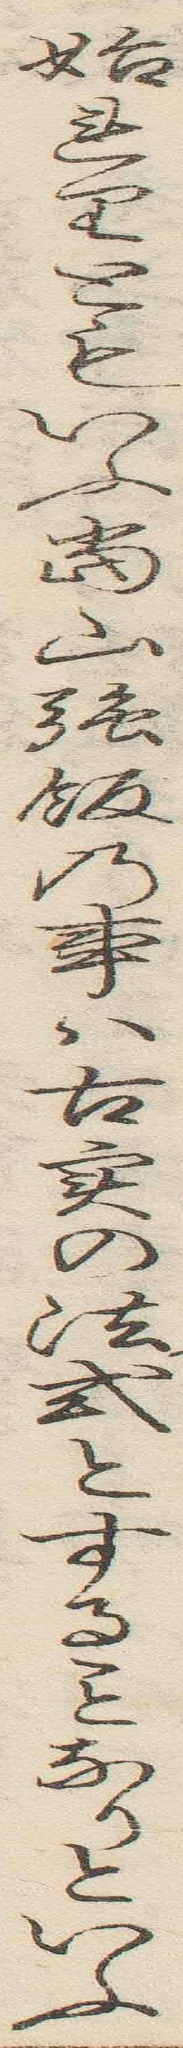始れりともいふ當山強飯の事は古実の法式とすることなりといふ
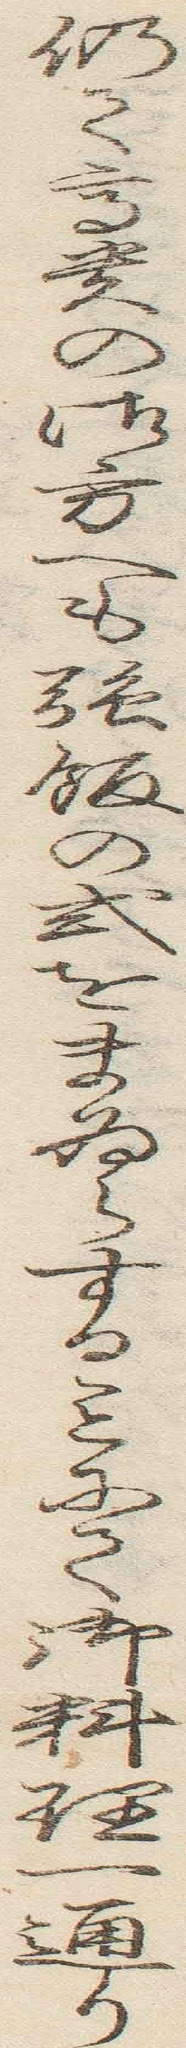仍て高貴の御方へも強飯の式をまゐらすることにて御料理一通り
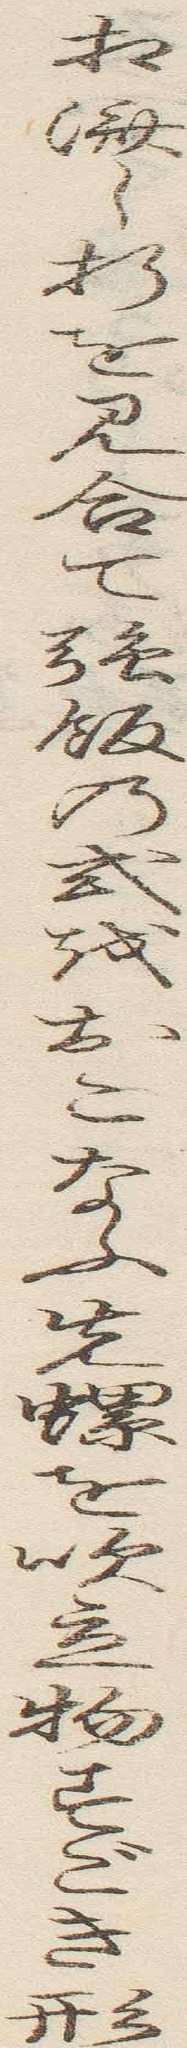相済し折を見合て強飯の式をおこなふ先螺を吹立物すごき形
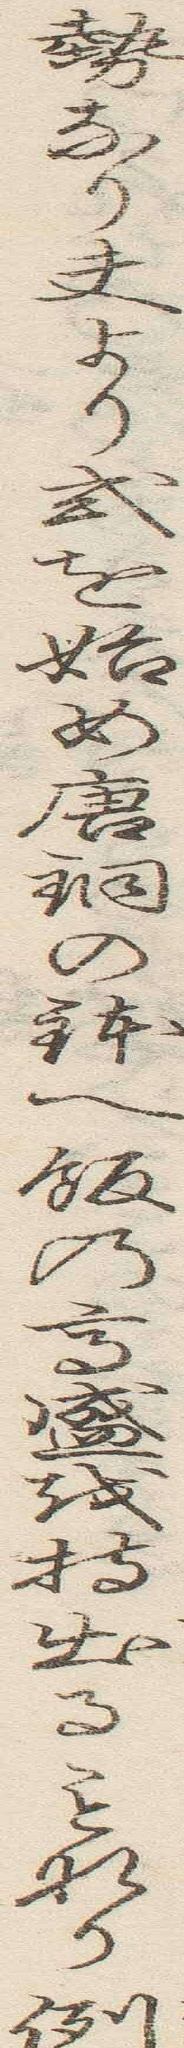勢なり夫より式を始め唐銅の鉢へ飯の高盛を持出ることなり例
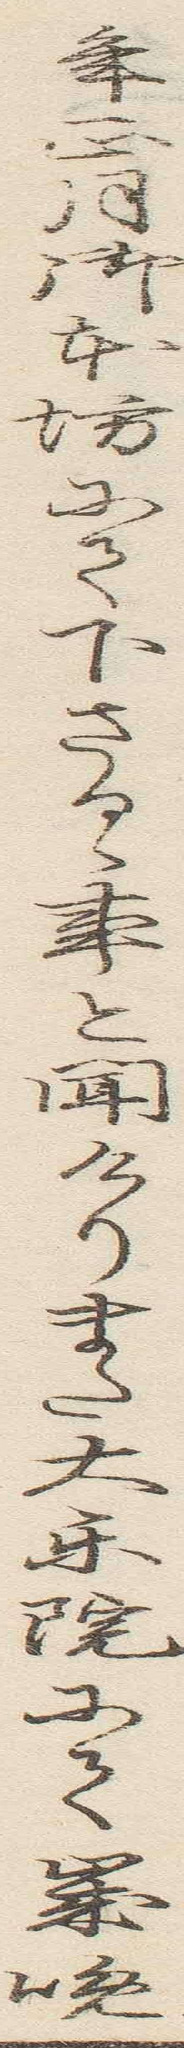年正月御本坊にて下さるゝ事と聞けりまた大楽院にて歳晩
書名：日光山志
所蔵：東京学芸大学附属図書館 国文学研究資料館
